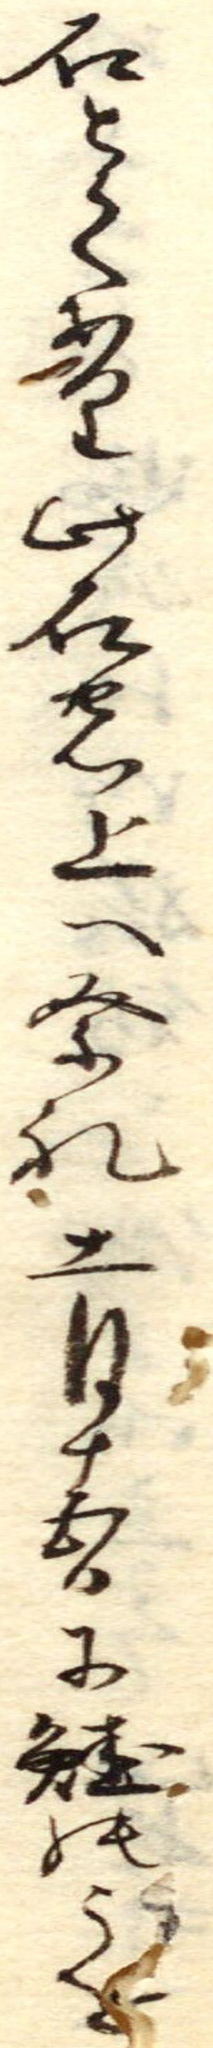石とてあり此石の上へ祭礼十一月十五日に鮭のうを
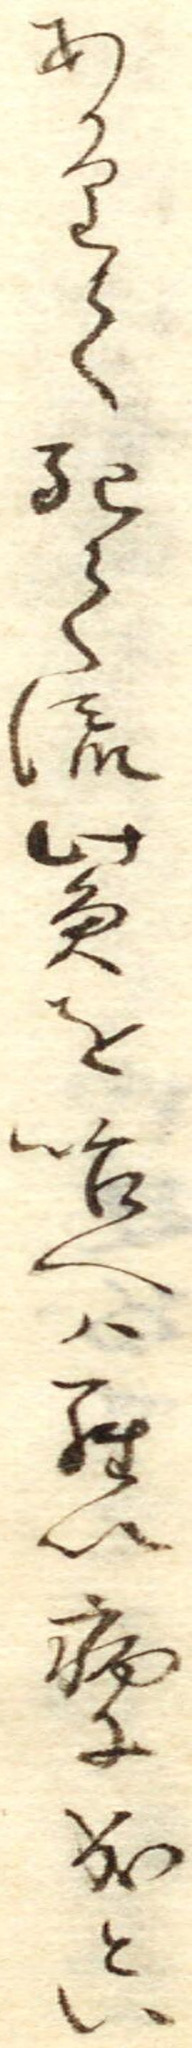あかりて死て流此魚を咋へは罹以病に成とい
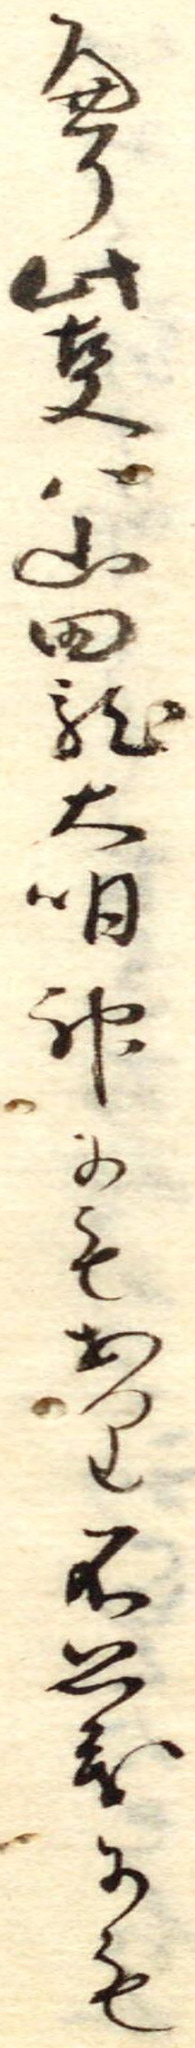へり此事は山田龍大明神にもあり不思義にも
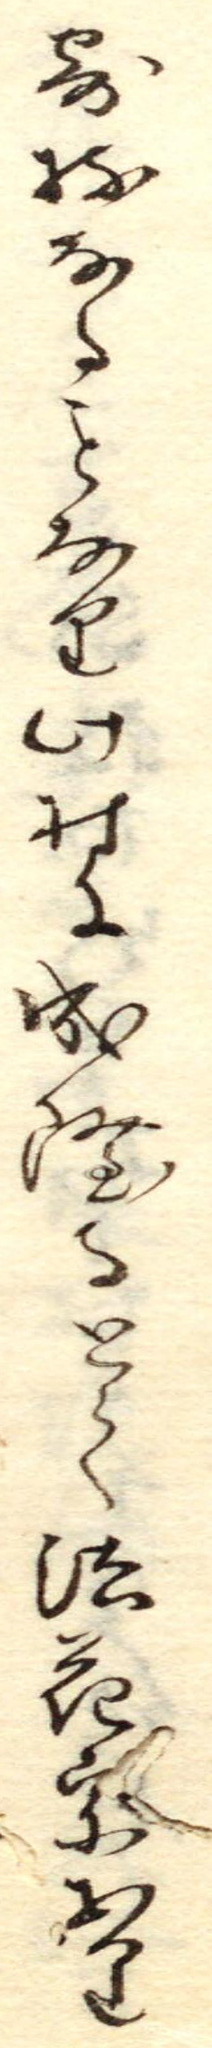寄持なることなり此村に成隆寺とて法花宗あり
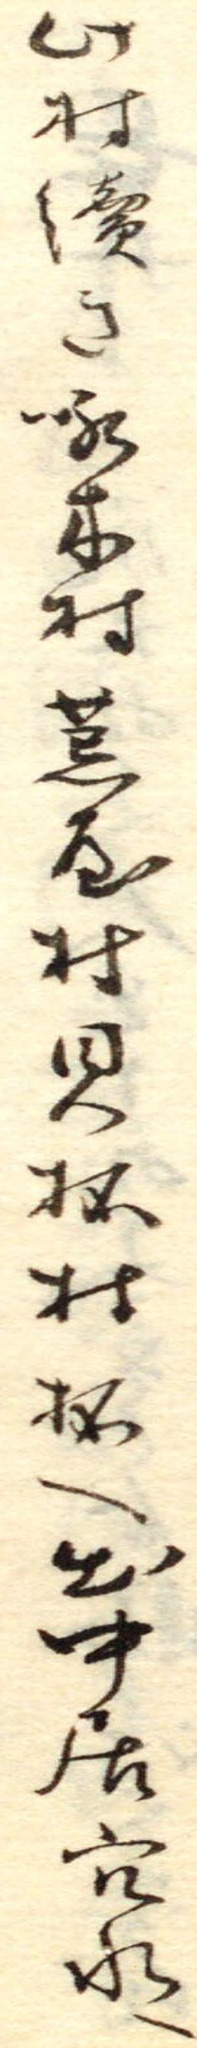此村続き吼木村荒屋村貝抔村抔へ出申居穴水へ
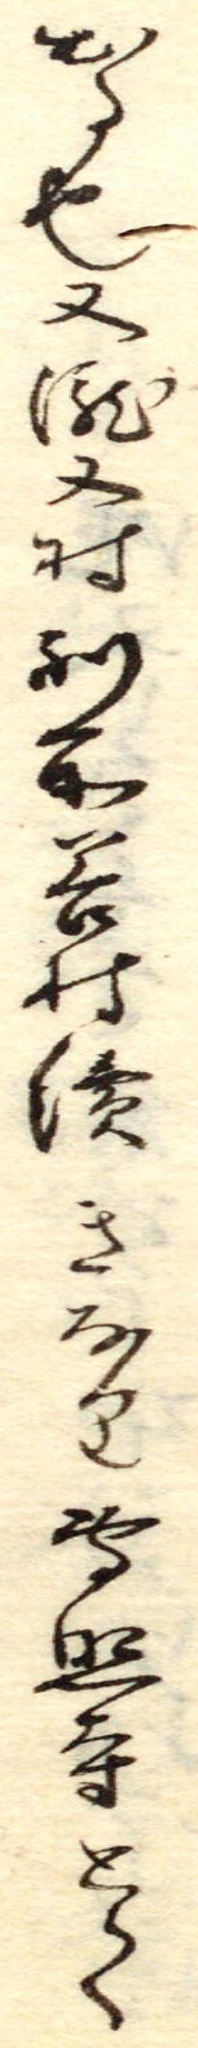出る也又瀧又村別所谷村続きなり専照寺とて
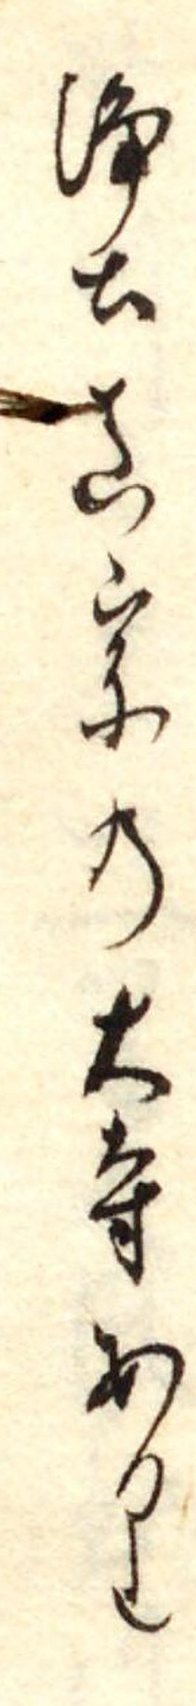浄土真宗の大寺あり
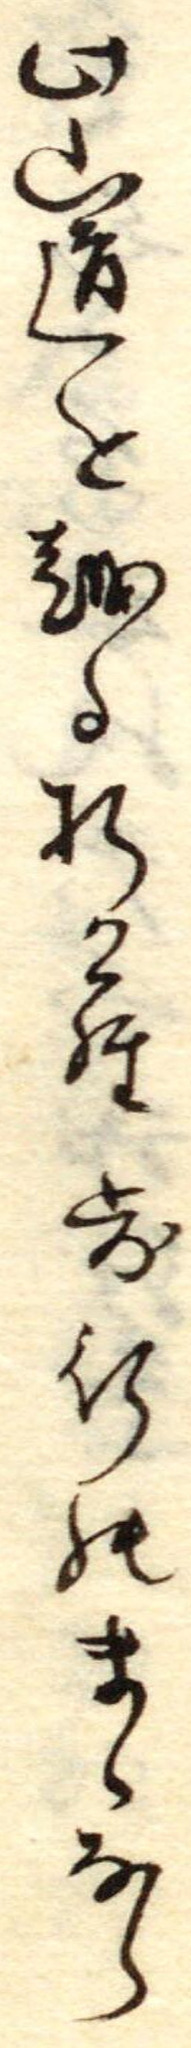此山道を越る折から歩行のまなら
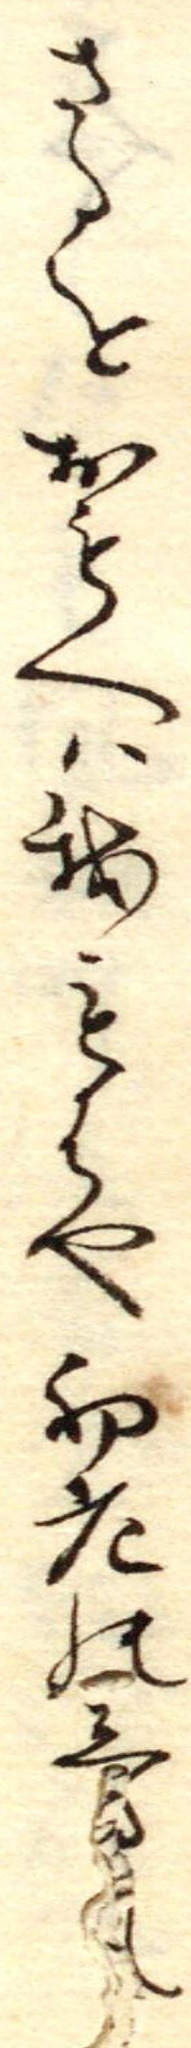さるをおもへは我もはや初老のしるし
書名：能登名跡誌
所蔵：Ishikawa Prefectural Library
